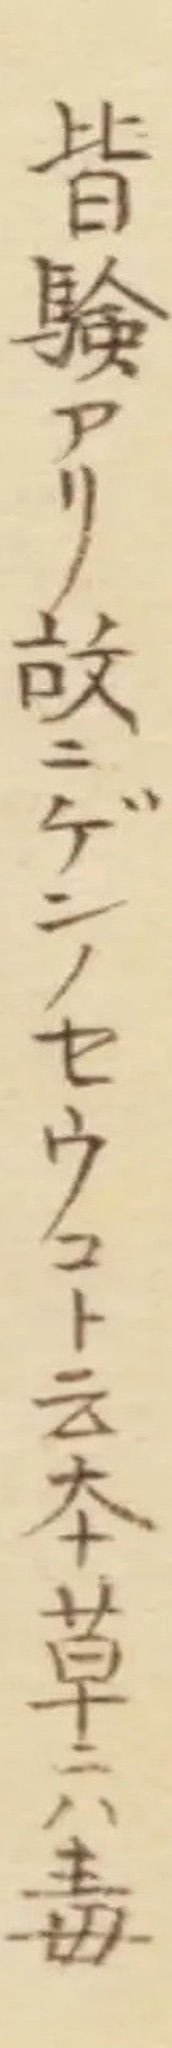皆験アリ故ニゲンノセウコト云本草ニハ毒
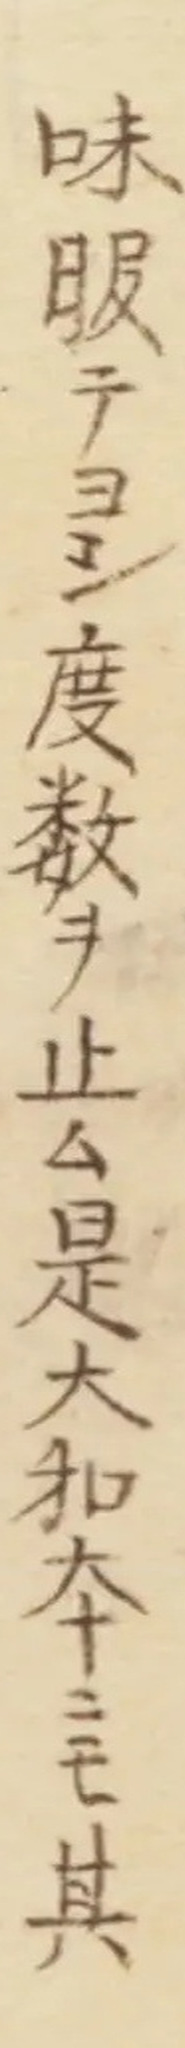味服シテヨシ度数ヲ止ム是大和本草ニモ其
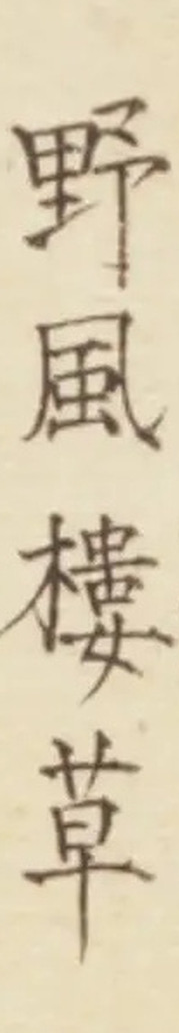野風楼草
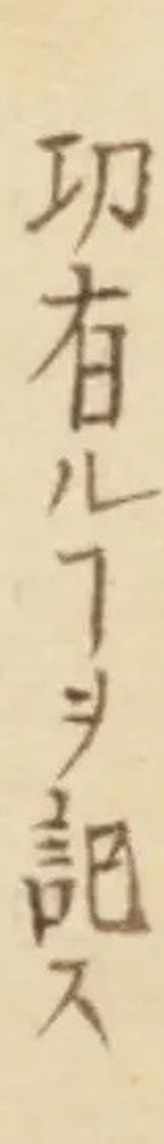功有ルコトヲ記ス
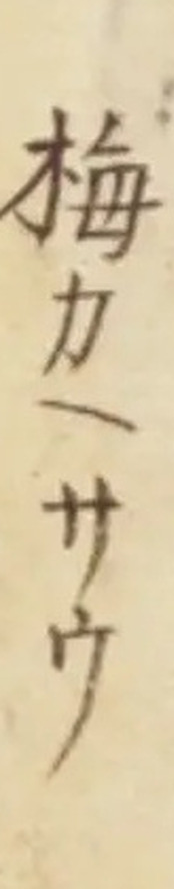梅カヘサウ
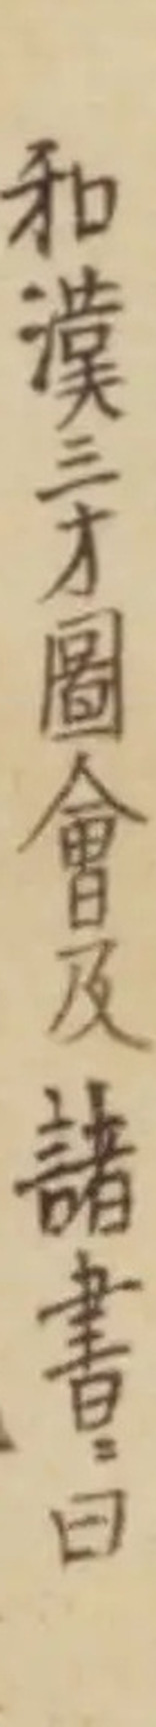和漢三才図会及諸書曰

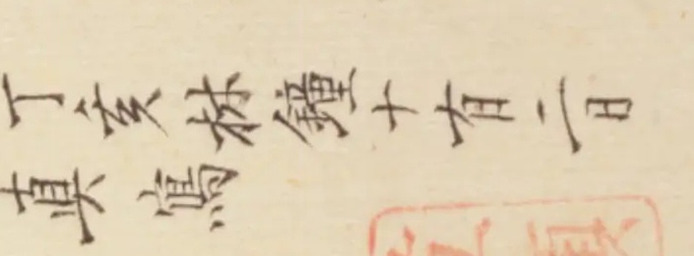丁亥林鐘十有二日
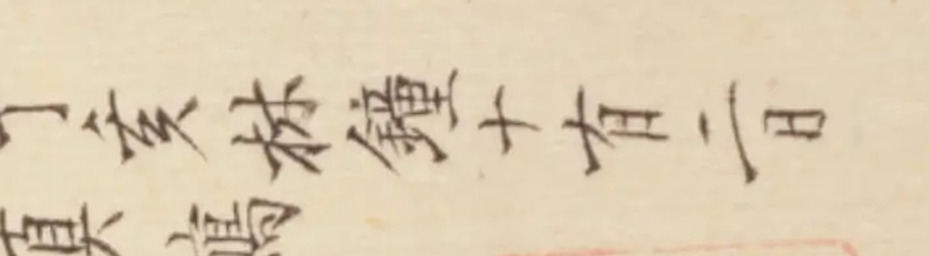丁亥林鐘十有二日

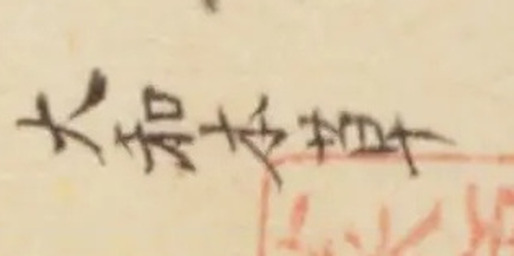大和本草
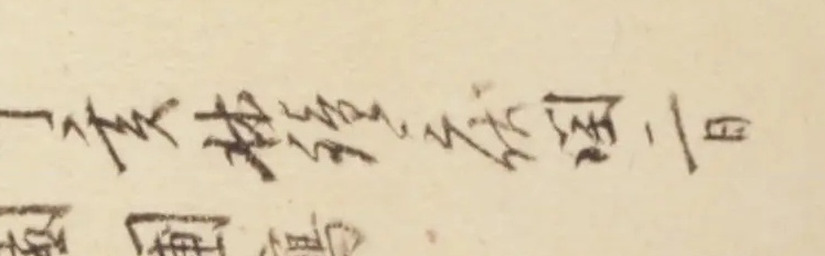丁亥林鐘三伏閏二日
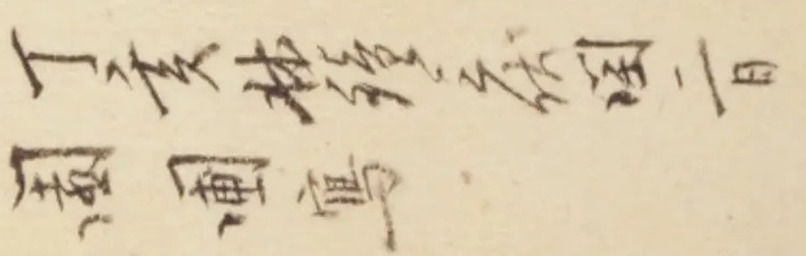丁亥林鐘三伏閏二日
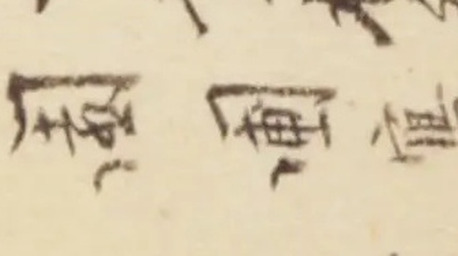園圃寫

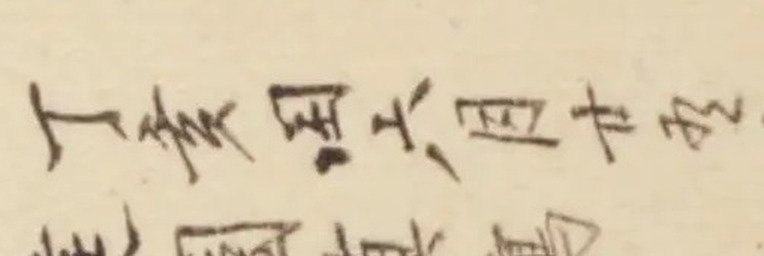丁亥閏六月廿有五日
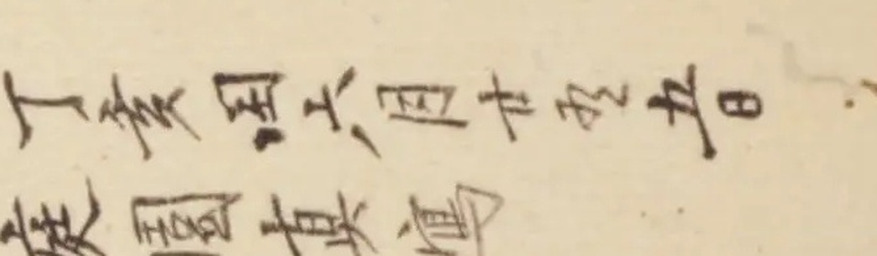丁亥閏六月廿有五日
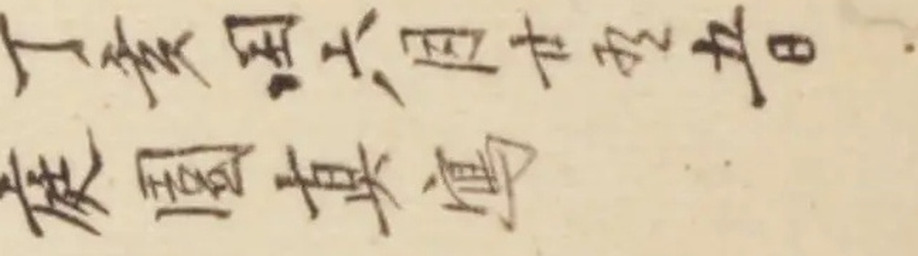庭園真写
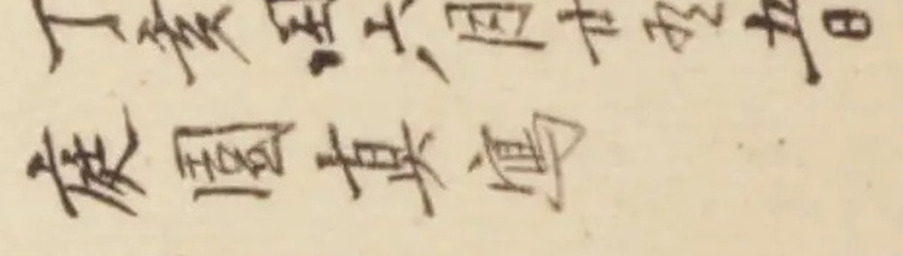庭園真写
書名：梅園草木花譜夏之部. 4
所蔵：国立国会図書館 National Diet Library, JAPAN
